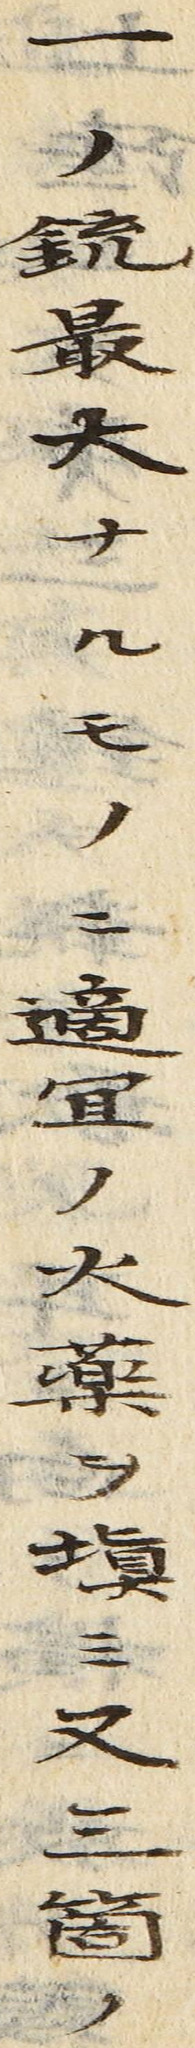一ノ銃最大ナルモノノ適宜ノ火薬ヲ填ミ又三箇ノ
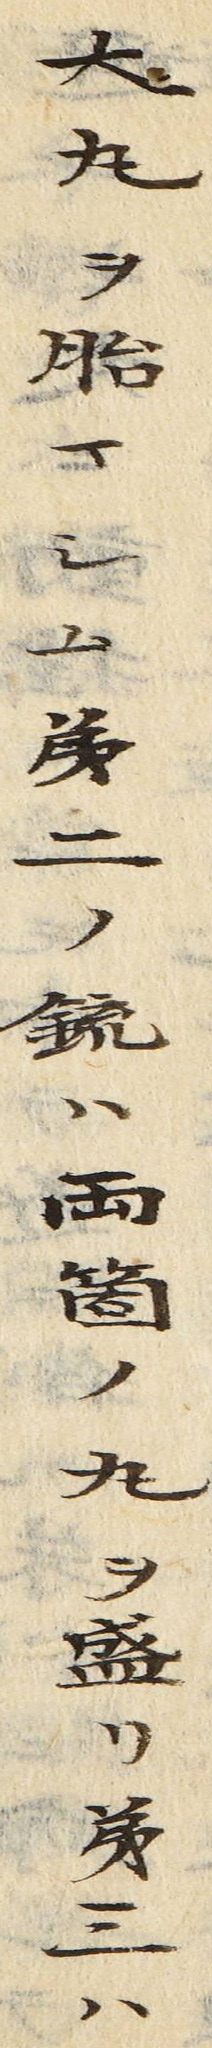大丸ヲ胎マシム第二ノ銃ハ両箇ノ丸ヲ盛リ第三ハ
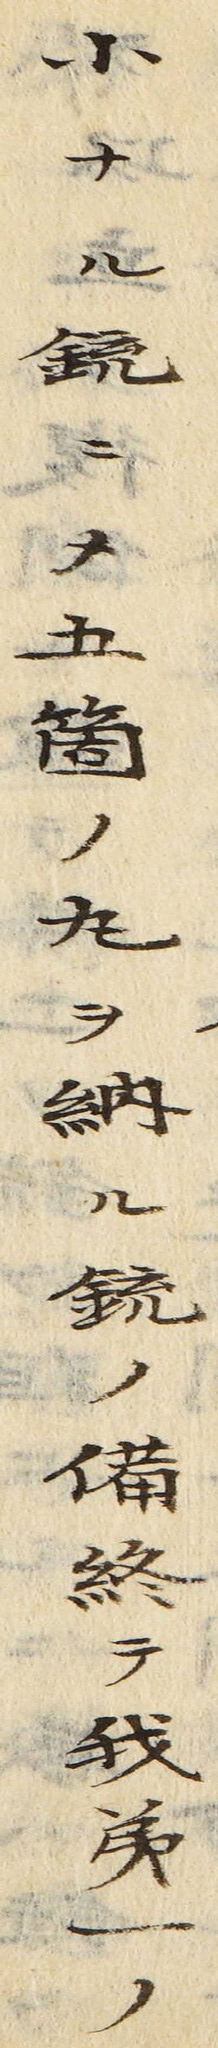小ナル銃ニシテ五箇ノ丸ヲ納ル銃ノ備終テ我第一ノ
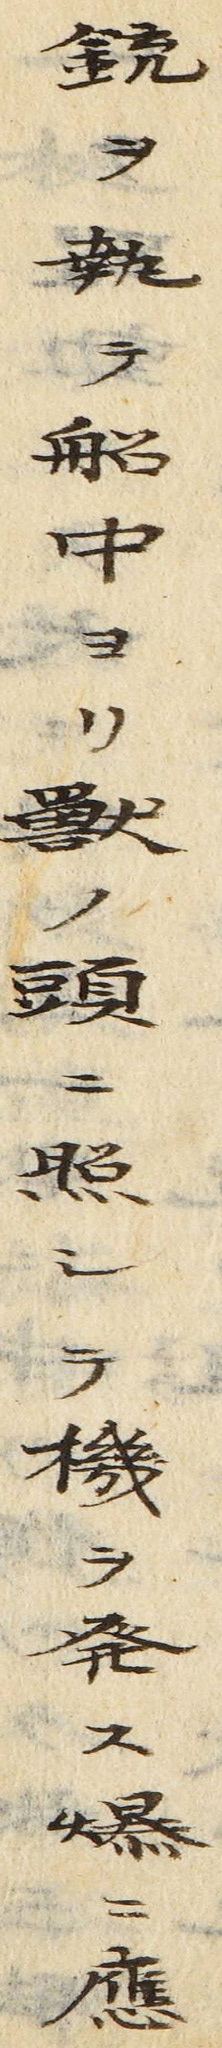銃ヲ執テ船中ヨリ獣ノ頭ニ照シテ機ヲ発ス爆ニ応

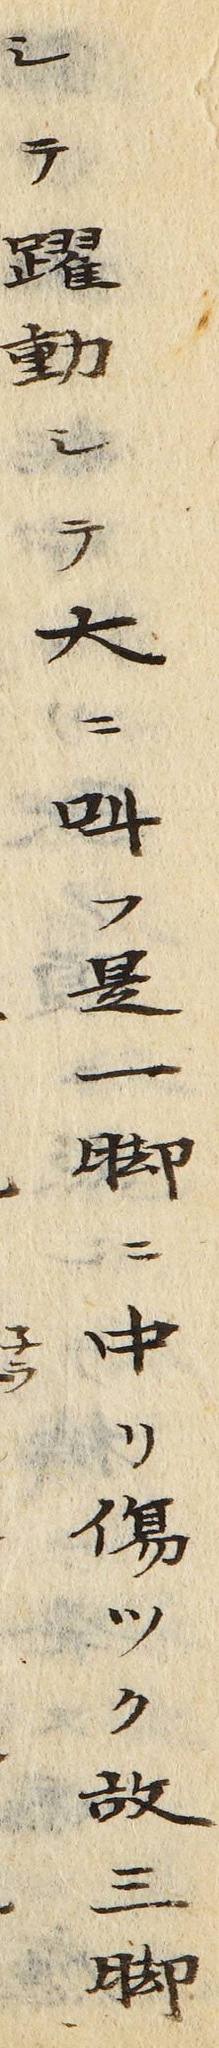シテ躍動シテ大ニ叫フ是一脚ニ中リ傷ツク故三脚
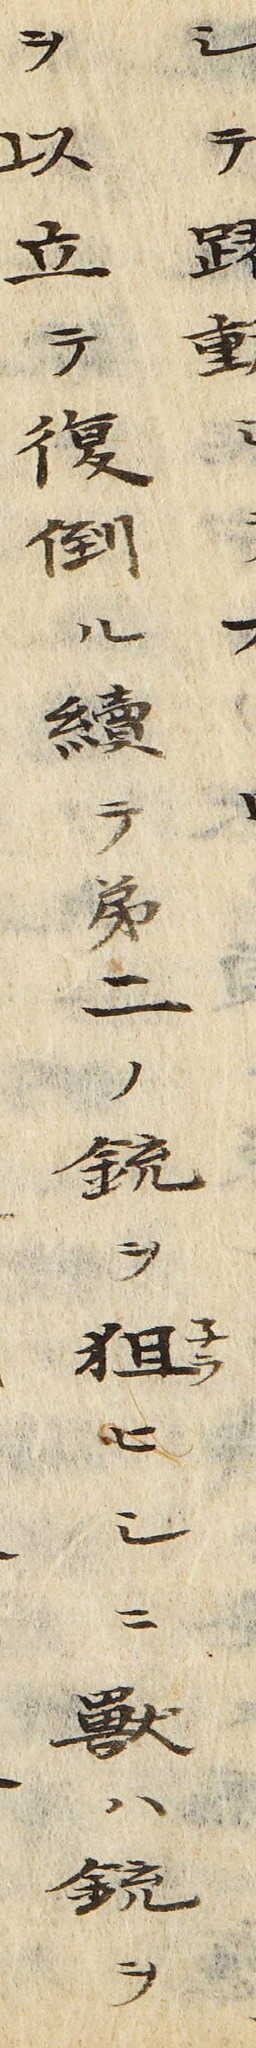ヲ以立テ復倒ル続テ第二ノ銃ヲ狙ヒシニ獣ハ銃ヲ
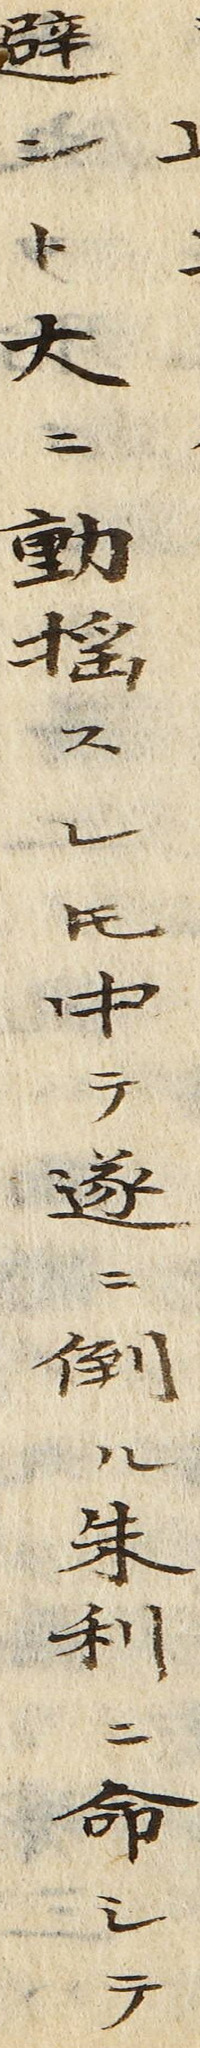避ント大ニ動揺スレトモ中テ遂ニ倒ル朱利に命シテ
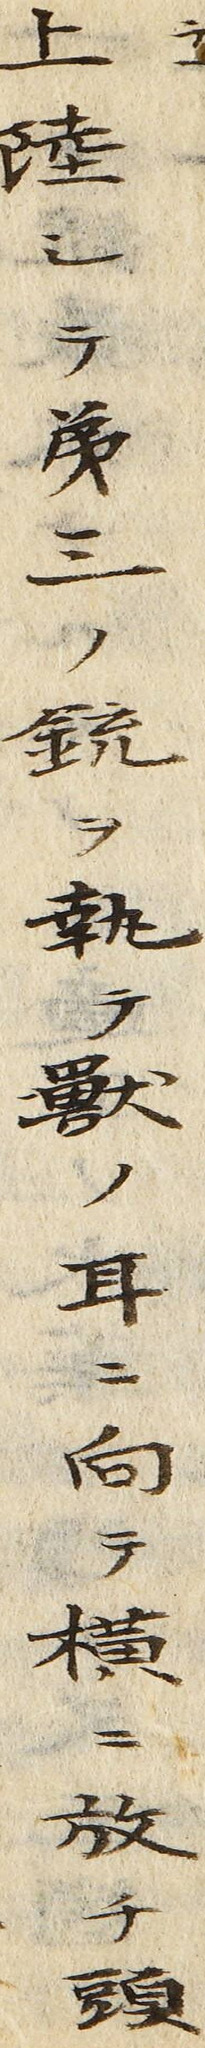上陸シテ第三ノ銃ヲ執テ獣ノ耳ニ向テ横ニ放チ頭
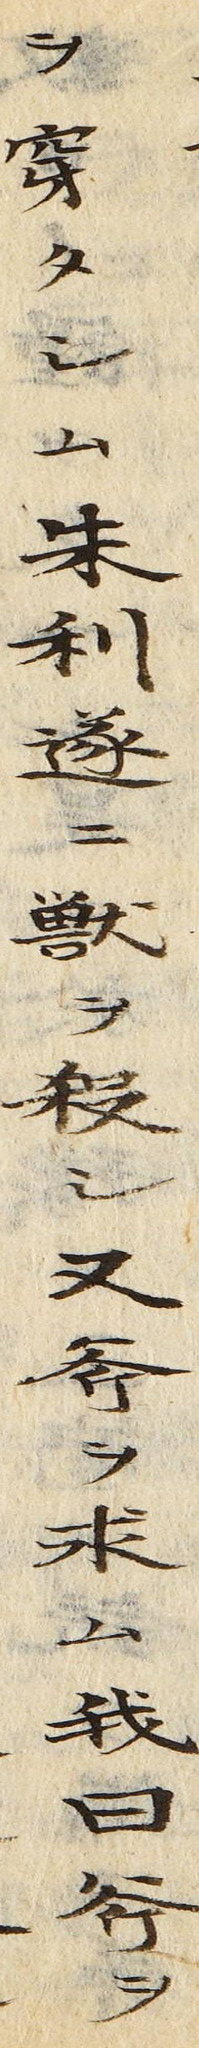ヲ穿タシム朱利遂ニ獣ヲ殺シ又斧ヲ求ム我曰斧ヲ
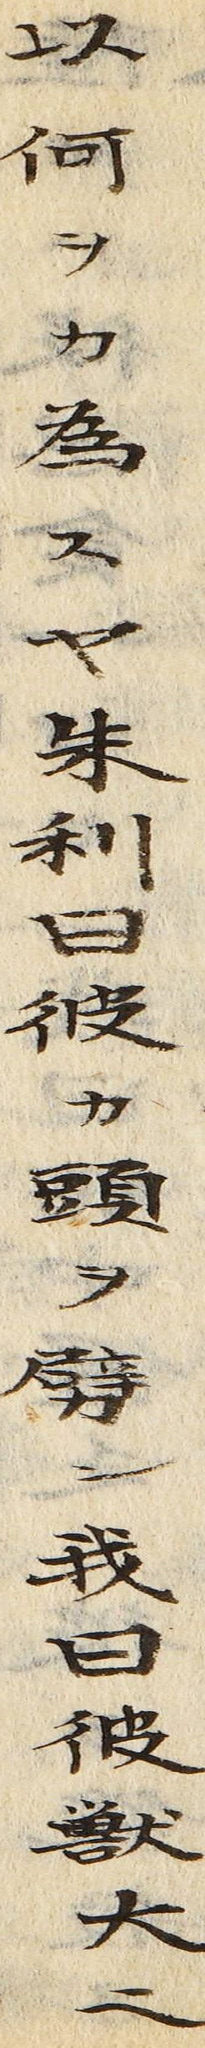以何ヲカ為スヤ朱利曰彼カ頭ヲ劈ン我曰彼獣大也
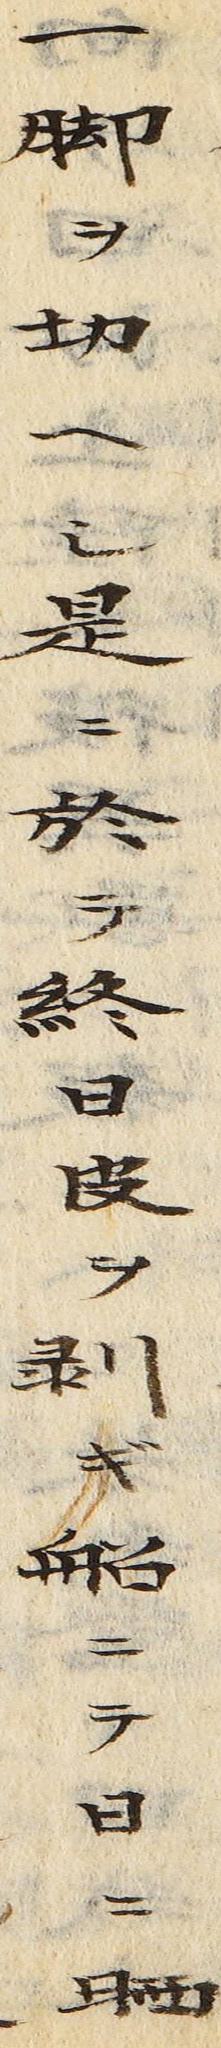一脚ヲ切ヘシ是ニ於テ終日皮ヲ剥ギ船ニテ日ニ晒
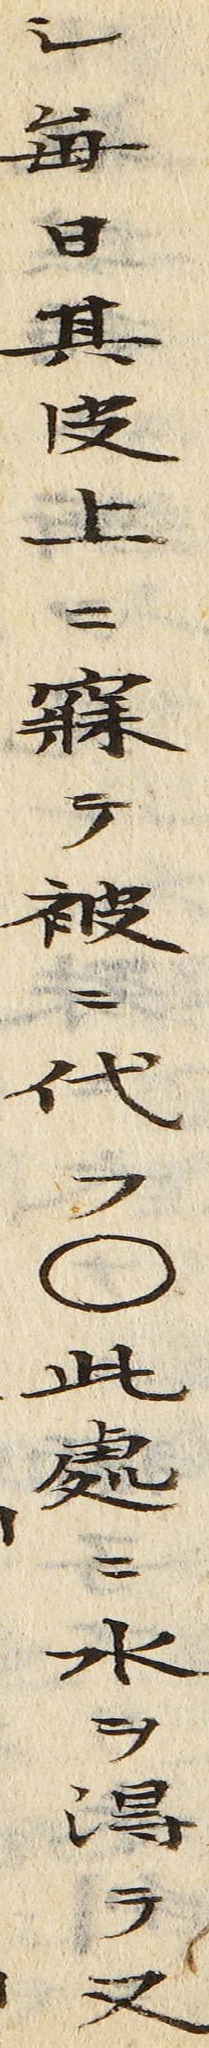シ毎日其皮上ニ寐テ被ニ代フ◯此処ニ水ヲ得テ又
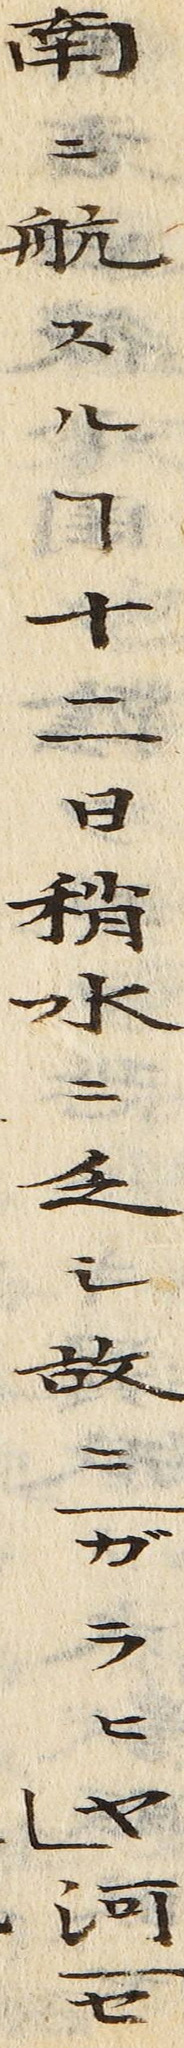南ニ航スルコト十二日稍水ニ乏シ故ニ「ガラヒヤ」河「セ
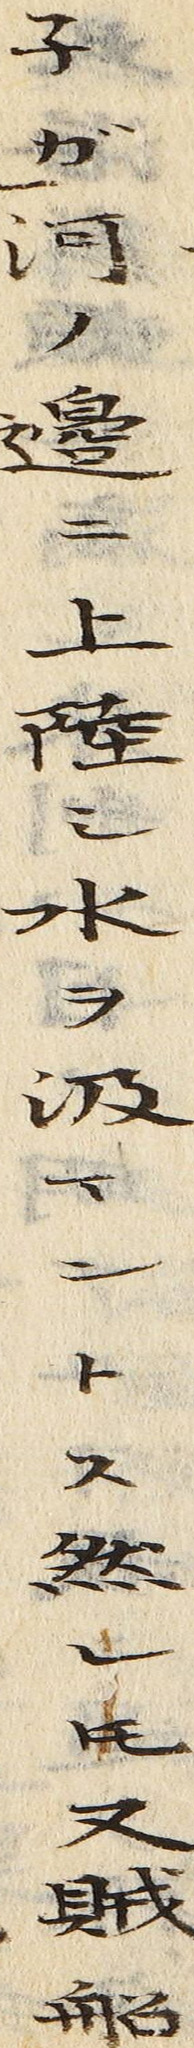ネガ」河ノ辺ニ上陸シ水ヲ汲マントス然トモ又賊船
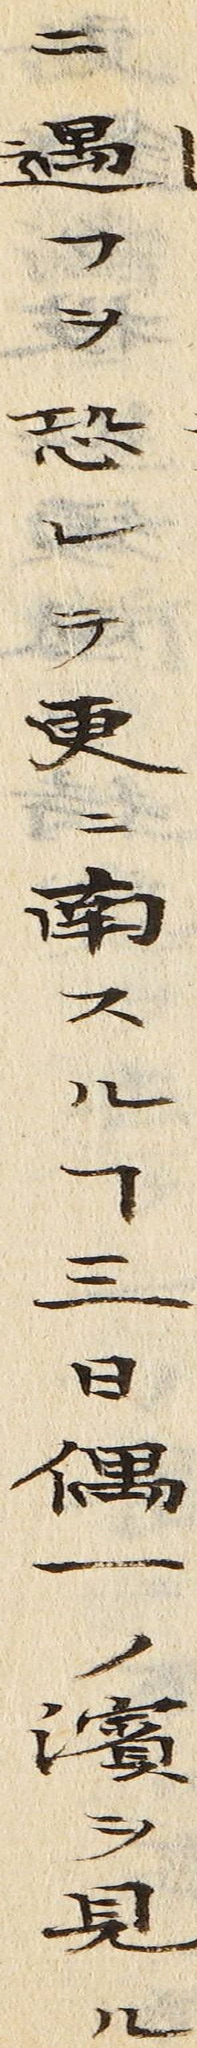ニ遇フヲ恐レテ更ニ南スルコト三日偶一ノ浜ヲ見ル
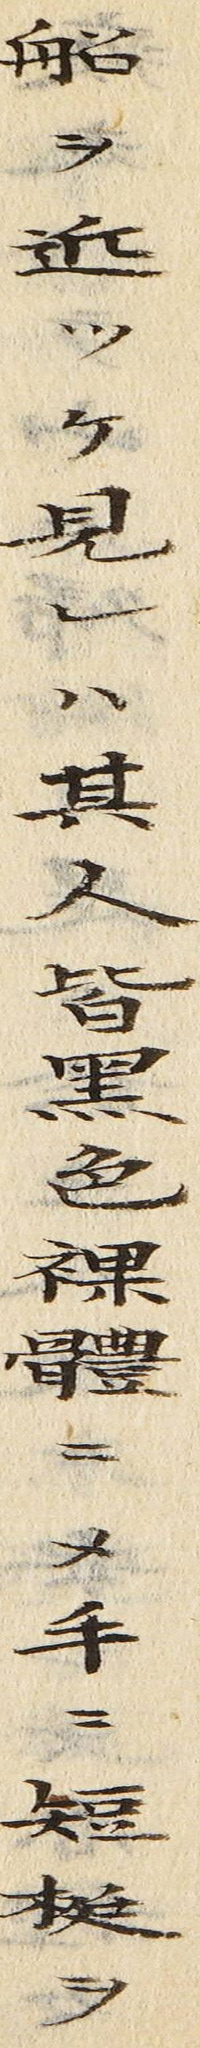船ヲ近ツケ見レハ其人皆黒色裸体ニシテ手ニ短梃ヲ
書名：漂流紀事
